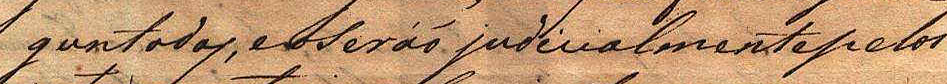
guntadas, e o seraõ judicialmente pelos
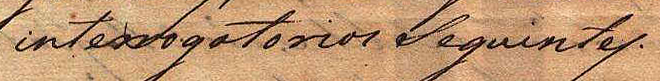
interrogatorios seguintes.
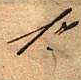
1.o
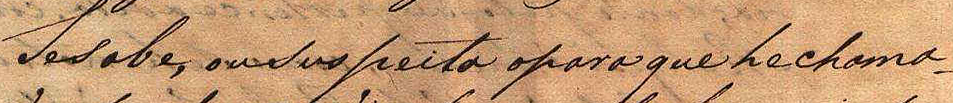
Se sabe, ou suspeita o para que he chama
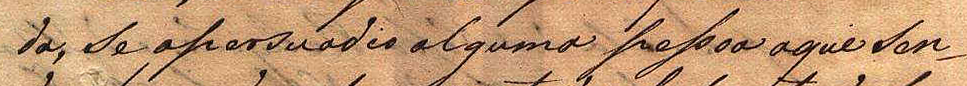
da, se a persuadio alguma pessoa a que sen
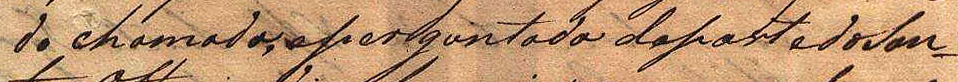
do chamada, e perguntada da parte do San
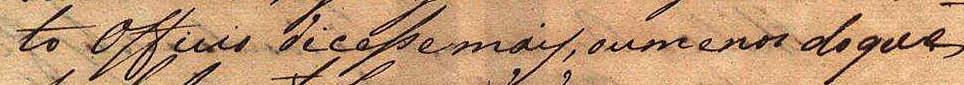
to Officio dicesse mais, ou menos do que
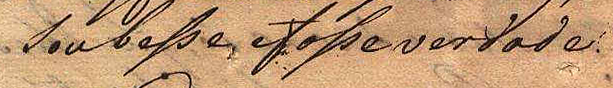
soubesse e fosse verdade.
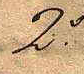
2.o
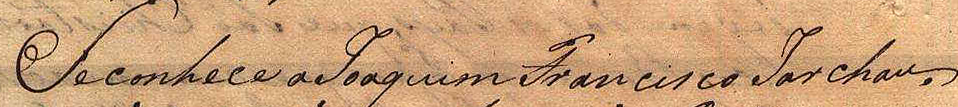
Se conhece a Ioaquim Francisco Iarchau
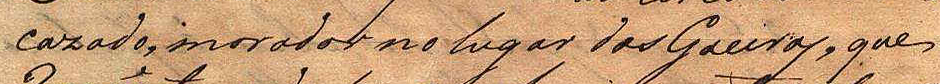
cazado, morador no lugar das Gaeiras, que
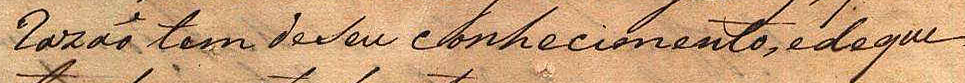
Razaõ tem de seu conhecimento, e de que
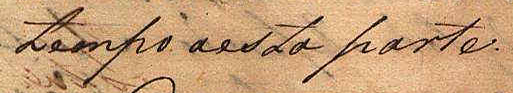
tempo a esta parte.
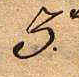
3.o
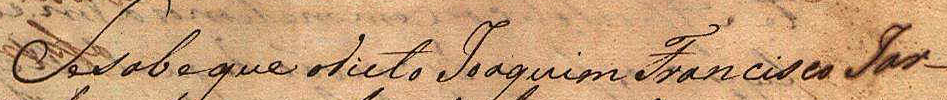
Se sabe que o dicto Ioaquim Francisco Iar
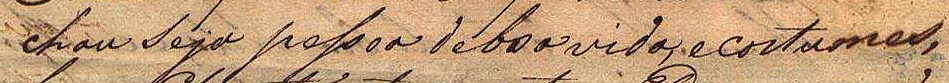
chau seja pessoa de boa vida, e costumes,
